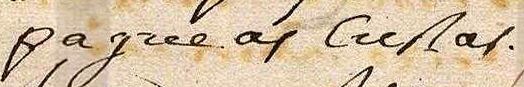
pague as custas.
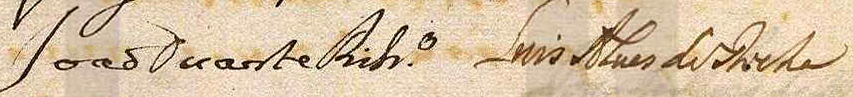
Joaõ Duarte Ribr.o Luis Alues de Rocha
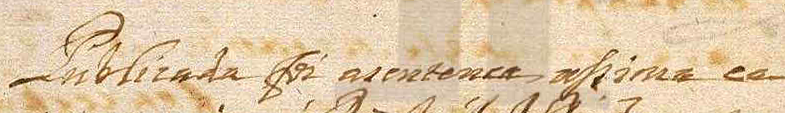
Publicada foi a sentença assima e a
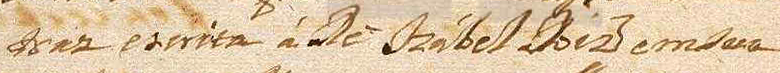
traz escrita á Ré Izabel Roiz̄ em sua
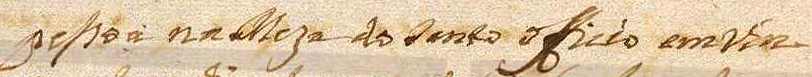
pessoa na Meza do santo officio em vin
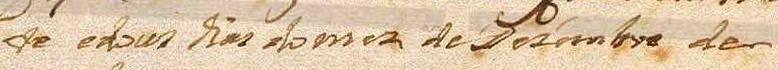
te e dous dias do mez de Dezembro de
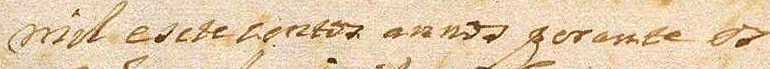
mil e setecentos annos perante os
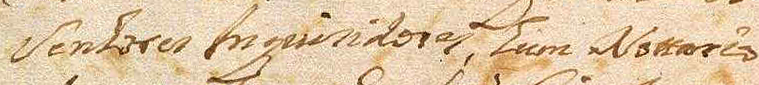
Senhores Inquizidores, hum Nottario
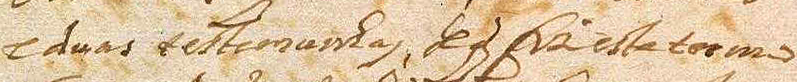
e duas testemunhas, de q̄ fiz este termo
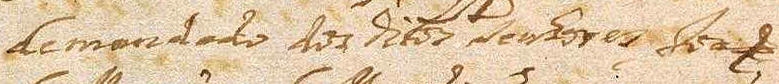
de mandado dos ditos senhores Joaõ
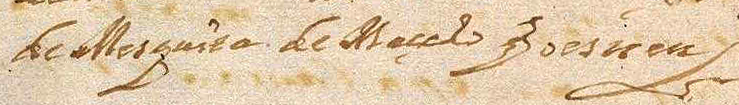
de Mesquita de Maçedo q̄ o escreuj
